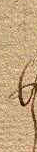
Rꝭ
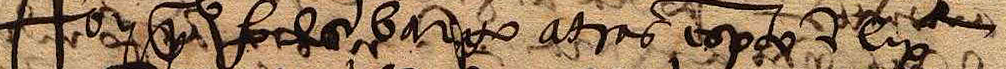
ffoy p̄do ho desēbargo atras esp̄to ē lixa
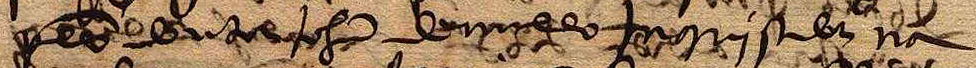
p̄llo doutor Johā de mello Jnqujsidor na
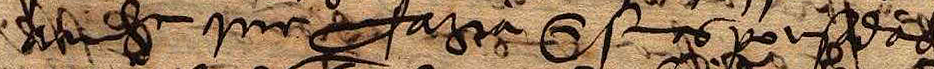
audja que fazia ē suas pousadas
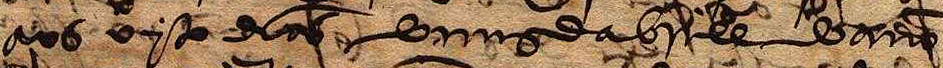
aos oyto dias do mes dabrill do anō
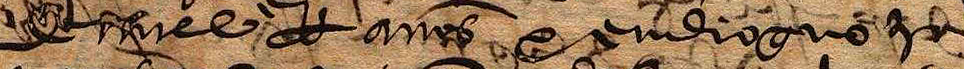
de mil bc R anōs e eu dioguo tra
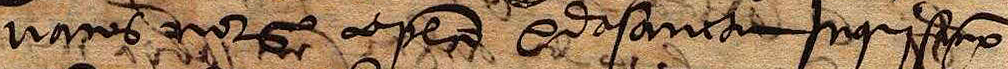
uaços notro apl̄co e da sancta Jnqujsição
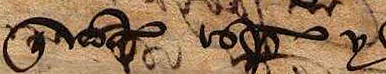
q̄ esto esp̄vy
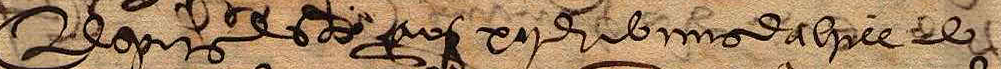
E despois desto aos xij di do mes dabrill do
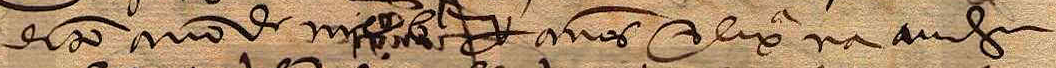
dito anō de mjl bc R an̄os ē lixa na audja
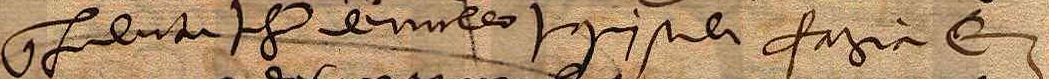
q̄ ho doutor Johā de mello Jnquisidor fazia Em
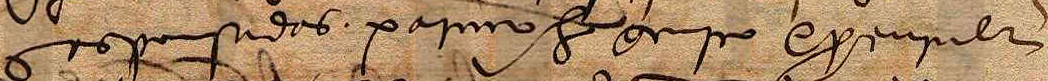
suas pousadas. pareceo ho genrro e ꝓcurador
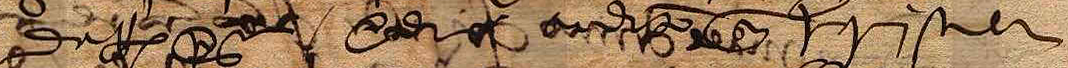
da Rꝭ p̄sa / e dise ao dito s̄r Jnqujsidor
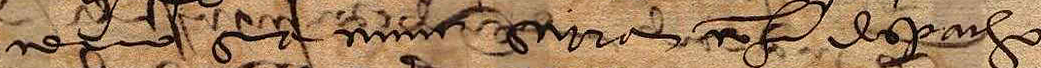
como sua merce sayra cō hū despacho
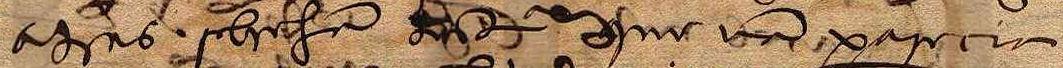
atras sobre hūa ta que nā parecia
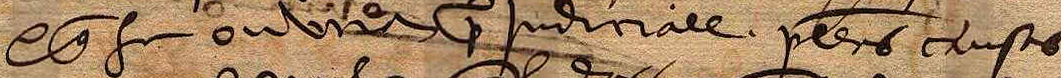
e q̄ ha ouvera p̄o Judiciall p̄llas causas
